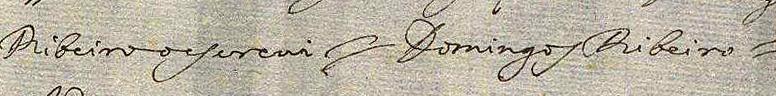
Ribeiro o escreui // Domingos Ribeiro //
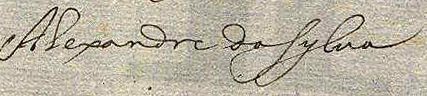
Alexandre da Sylua
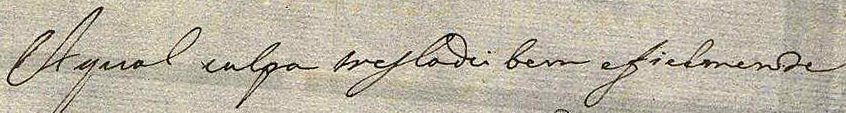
A qual culpa tresladei bem e fielmente
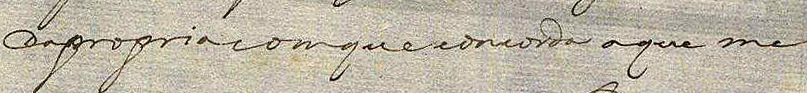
da propria com que concorda a que me
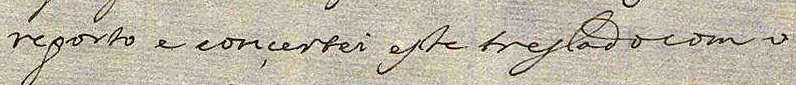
reporto e concertei este treslado com o
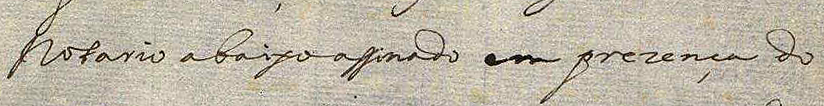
notario abaixo assinado em prezença do
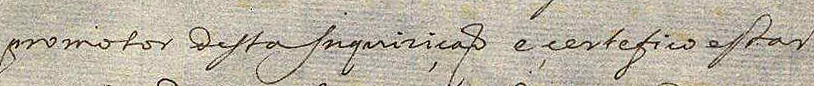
promotor desta jnquiziçaõ e certefico estar
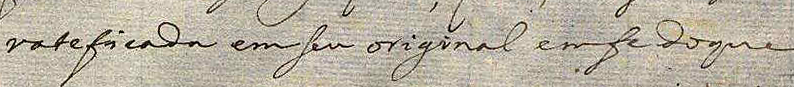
rateficada em seu original em fe do que
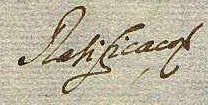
Ratificaçaõ
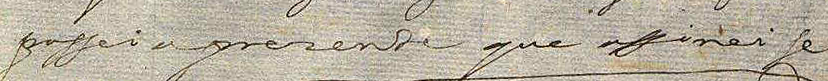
passei a prezente que assinei se
